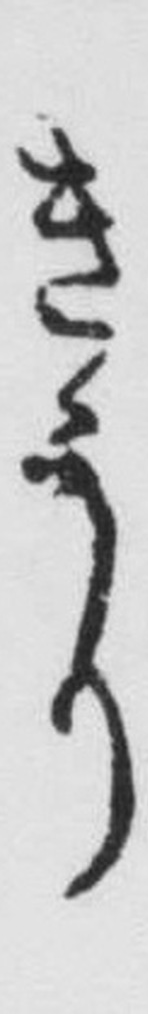きうり
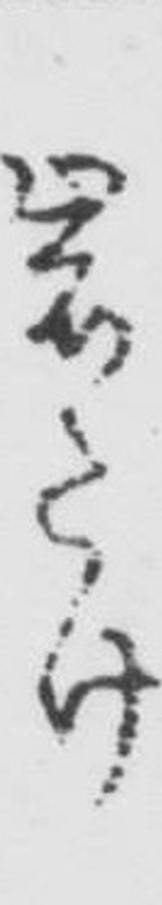岩たけ
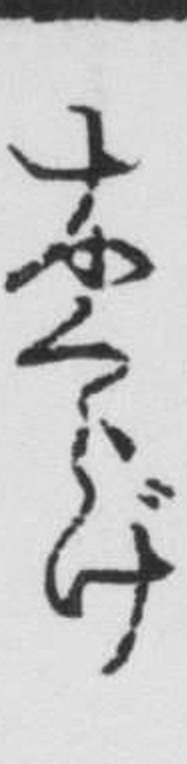木くらげ
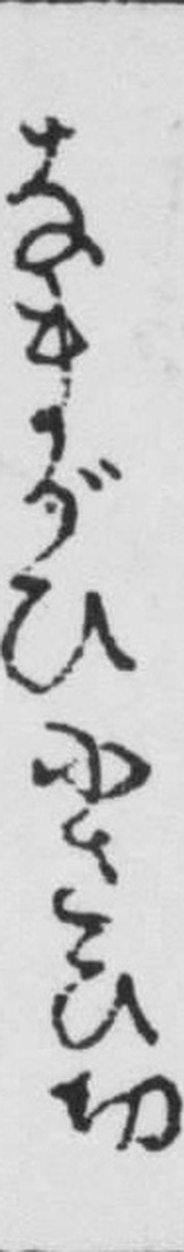なまがひ小さひ切
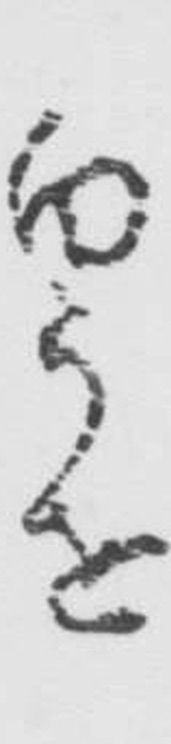白うを
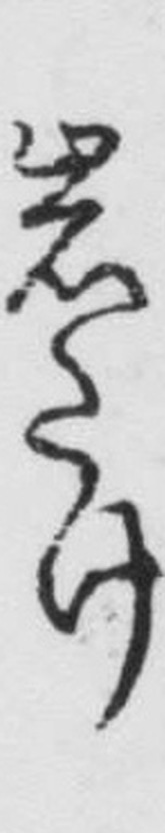岩たけ
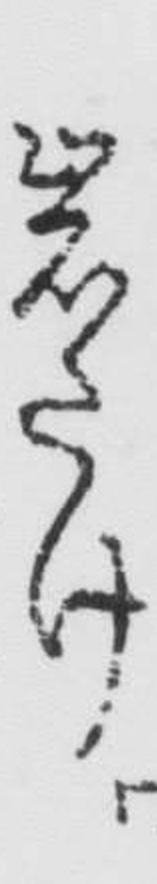岩たけ
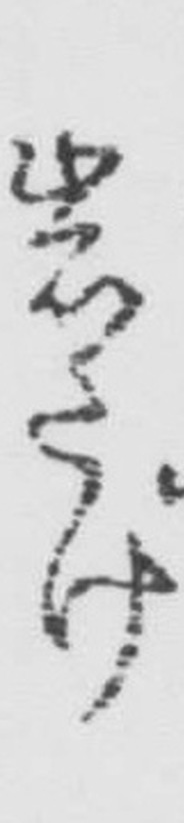岩たけ
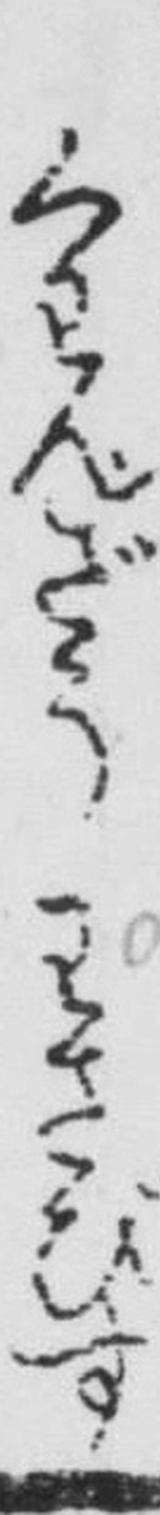くわんざうわさびす
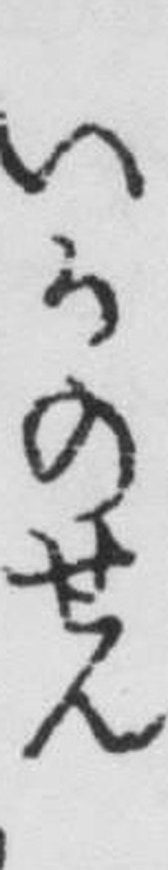いかのせん
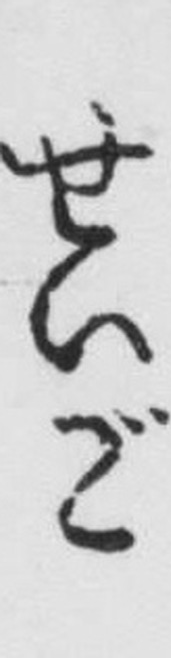せいご
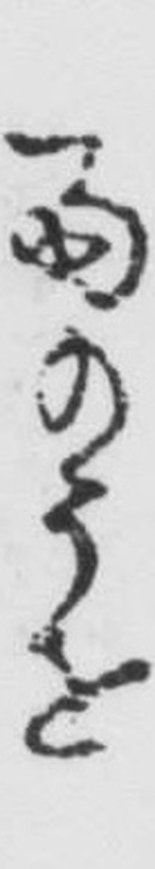雨のうを
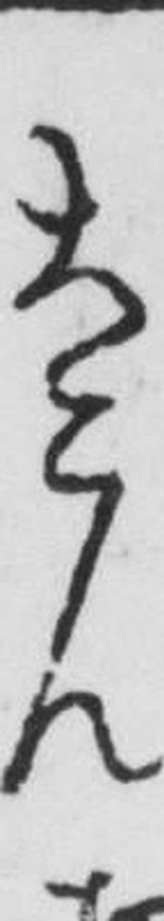大こん
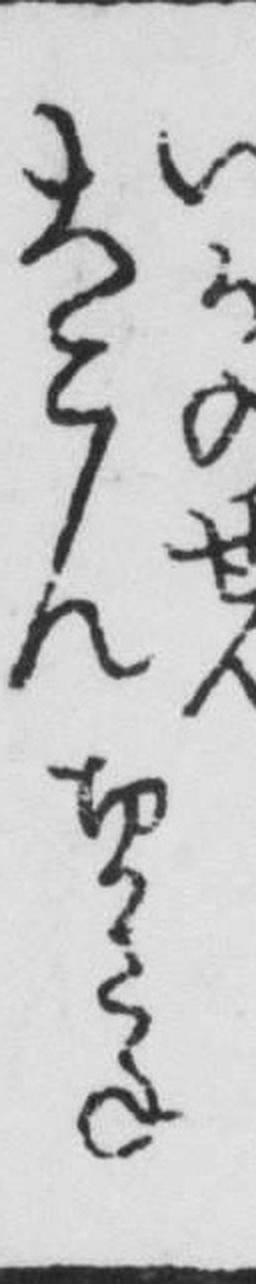大こん切かさね
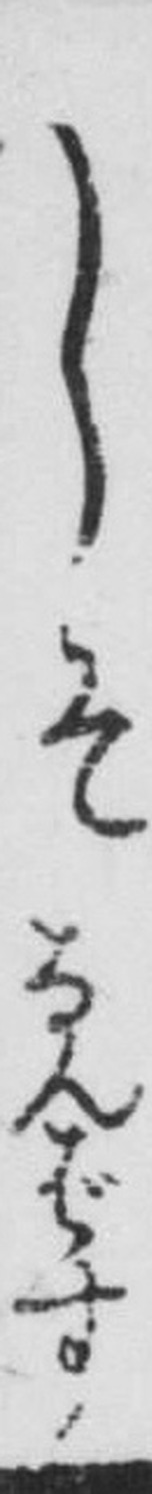しそなんばす
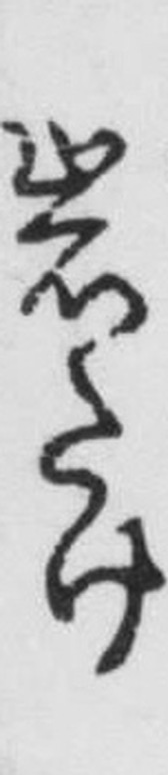岩たけ
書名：諸家通用/即席料理
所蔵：大阪府立大学学術情報センター 国文学研究資料館
